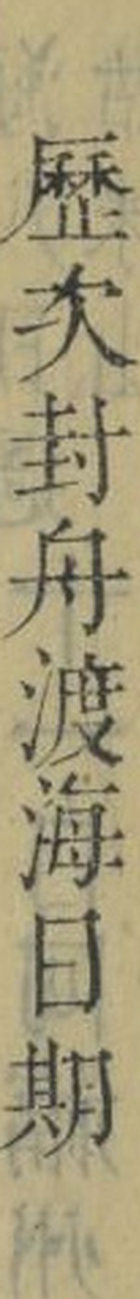歷次封舟渡海日期
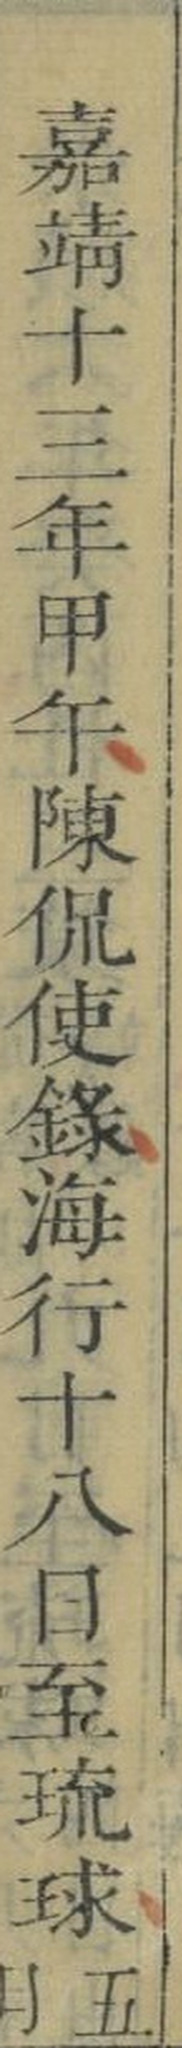嘉靖十三年甲午陳侃使錄海行十八日至琉球五月
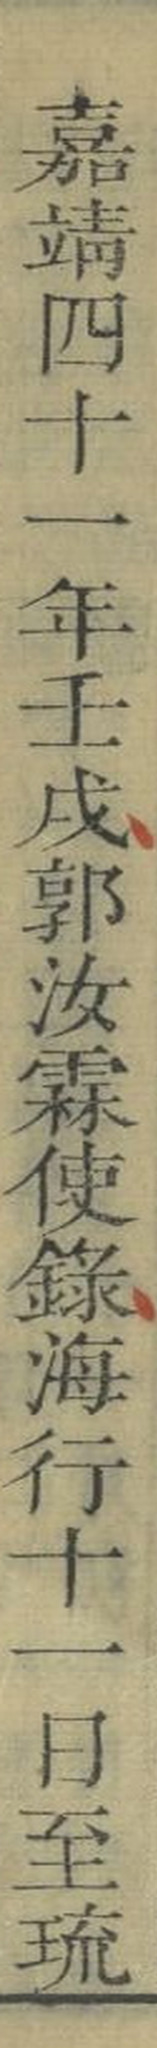嘉靖四十一年壬戌郭汝霖使錄海行十一日至琉

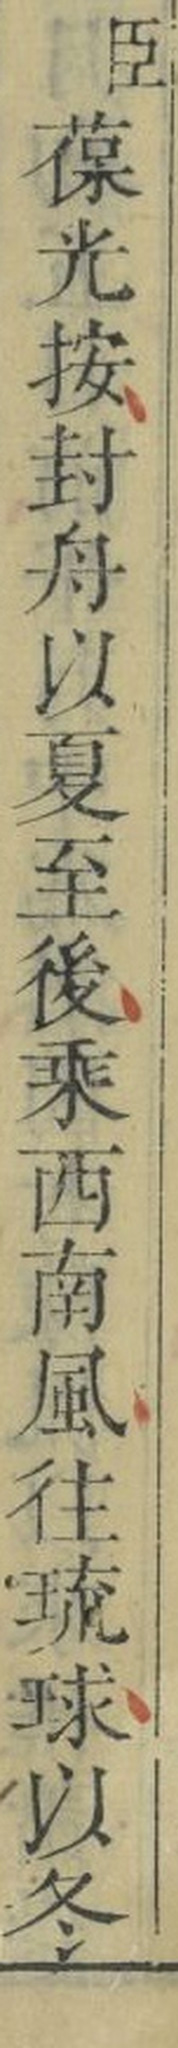臣葆光按封舟以夏至後乘西南風往琉球以冬
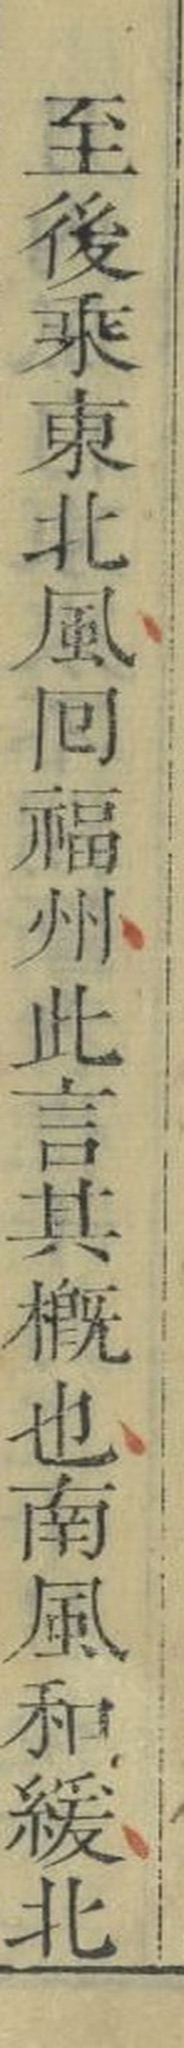至後乘東北風囘福州此言其槪也南風和緩北
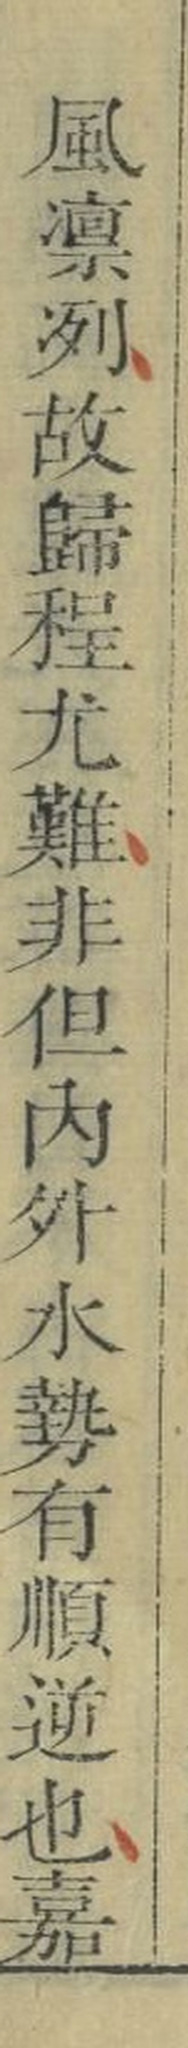風凛冽故歸程尤難非但内外水勢有順逆也嘉
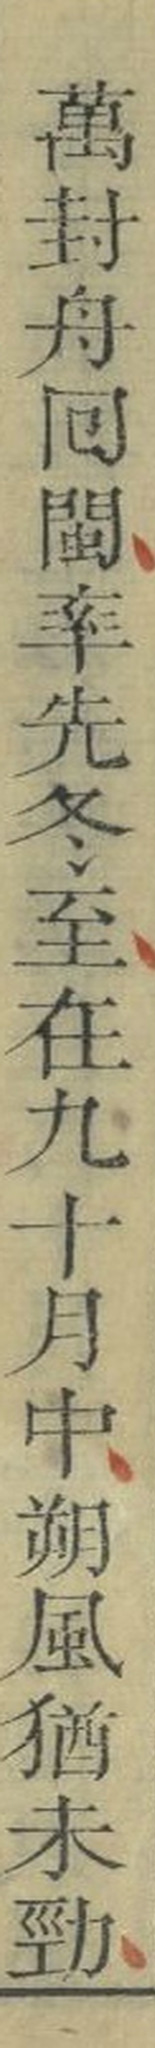萬封舟囘閩率先冬至在九十月中朔風猶未勁
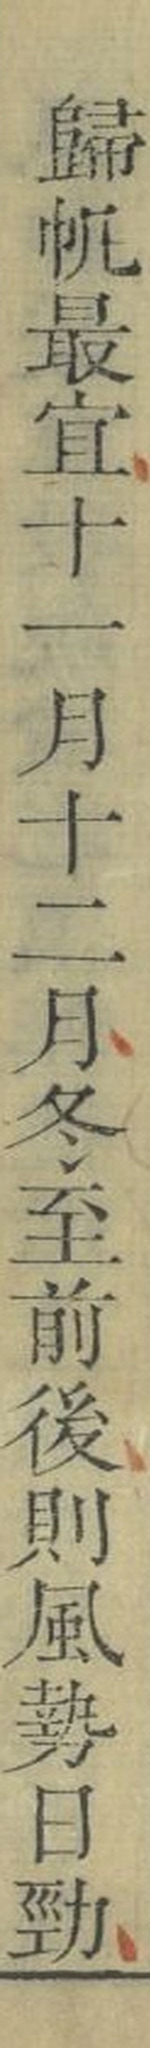歸帆最宜十一月十二月冬至前後則風勢日勁
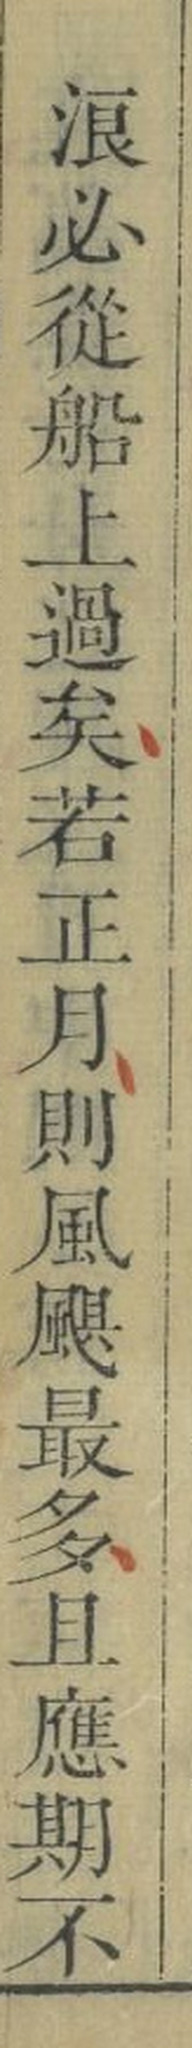浪必從船上過矣若正月則風颶最多且應期不

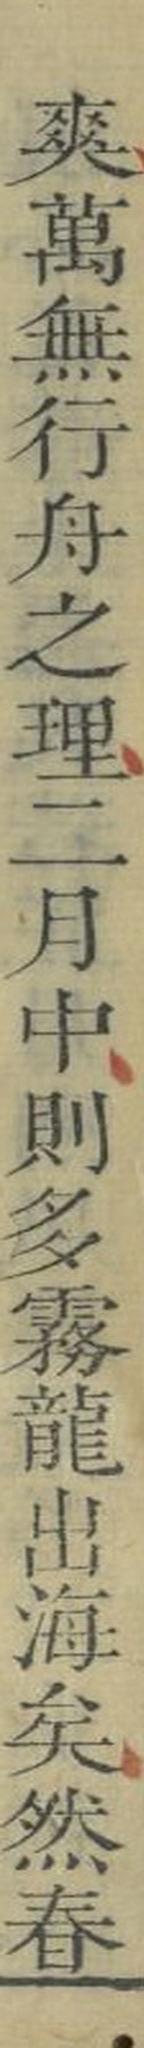爽萬無行舟之理二月中則多霧龍出海矣然春
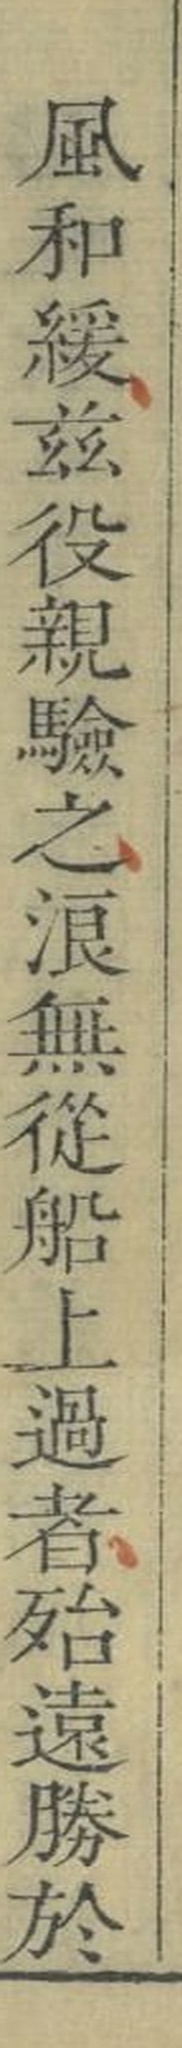風和緩茲役親驗之浪無從船上過者殆遠勝於
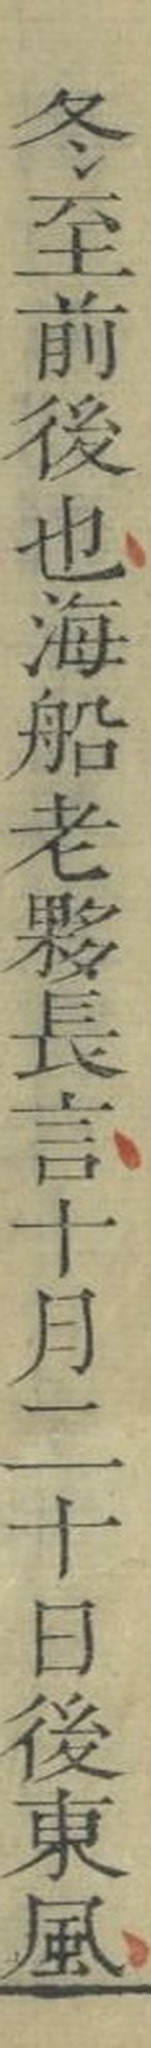冬至前後也海船老夥長言十月二十日後東風
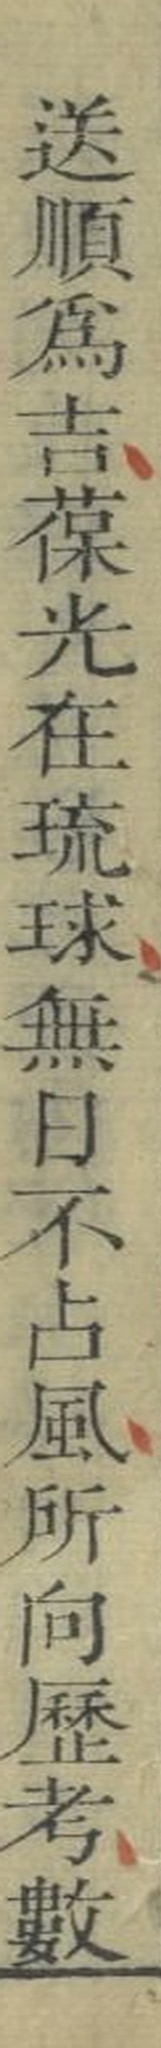送順爲吉葆光在琉球無日不占風所向歷考數
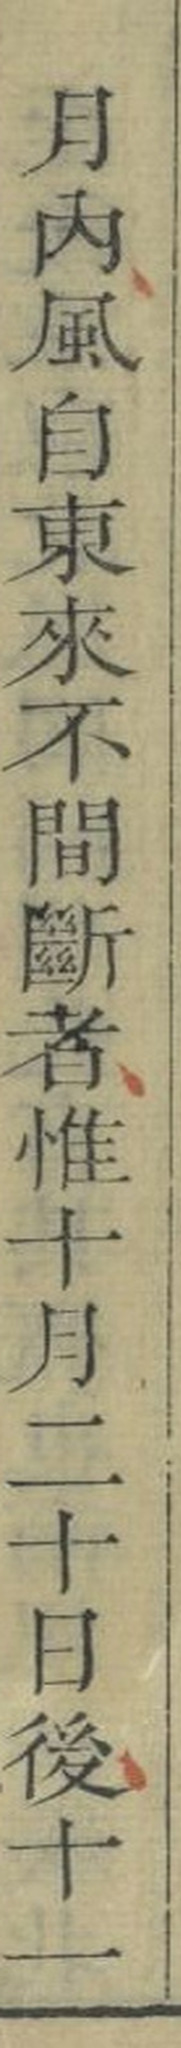月内風自東來不間斷者惟十月二十日後十一
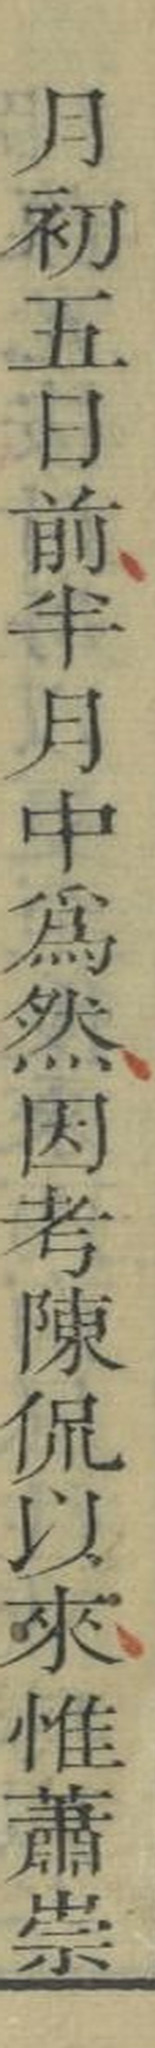月初五日前半月中爲然因考陳侃以來惟蕭崇
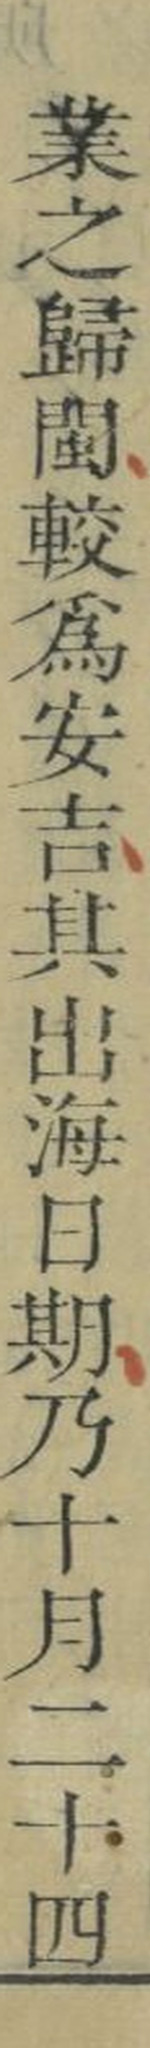業之歸閩較爲安吉其出海日期乃十月二十四
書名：中山伝信録 巻一、巻二
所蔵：University of the Ryukyus Library
